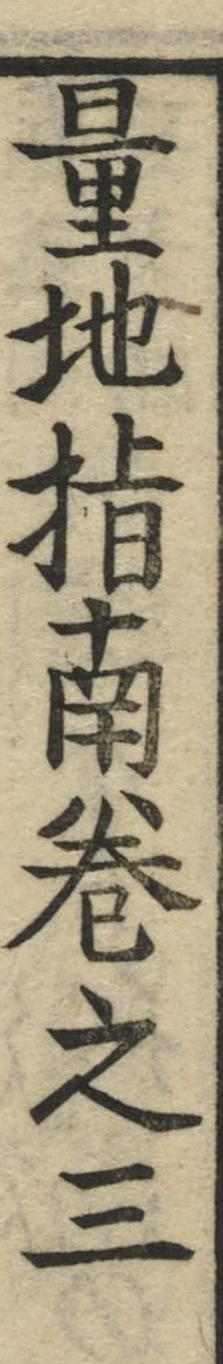量地指南巻之三
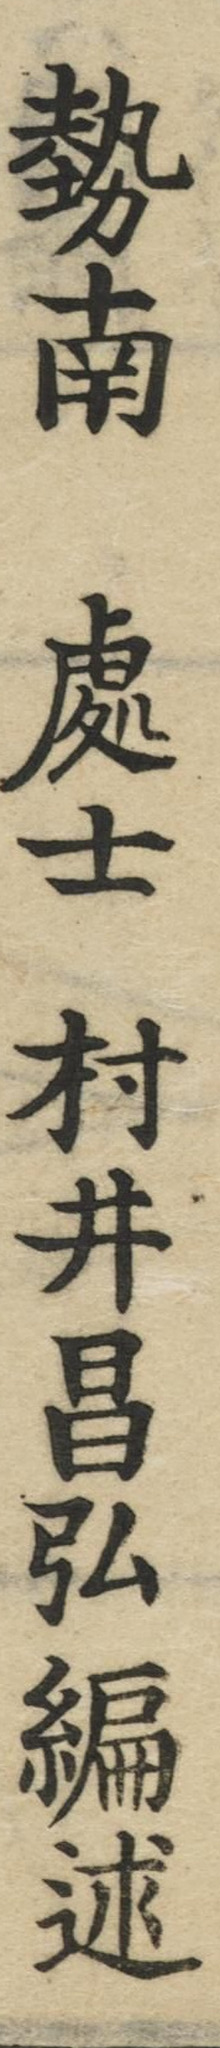勢南處士村井昌弘編述
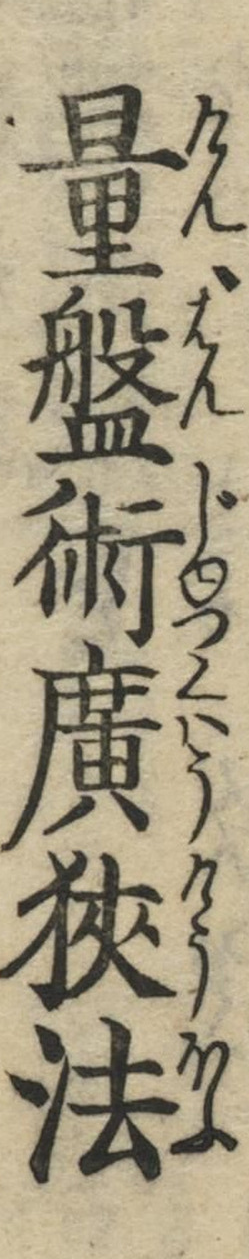量盤術廣狭法
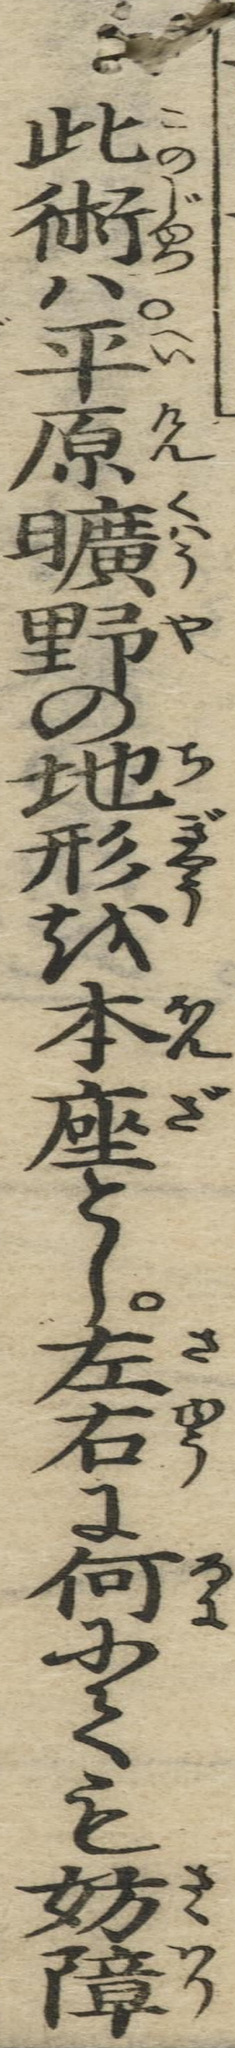此術は。平原広野の地形を本座とし。左右に何にても妨障
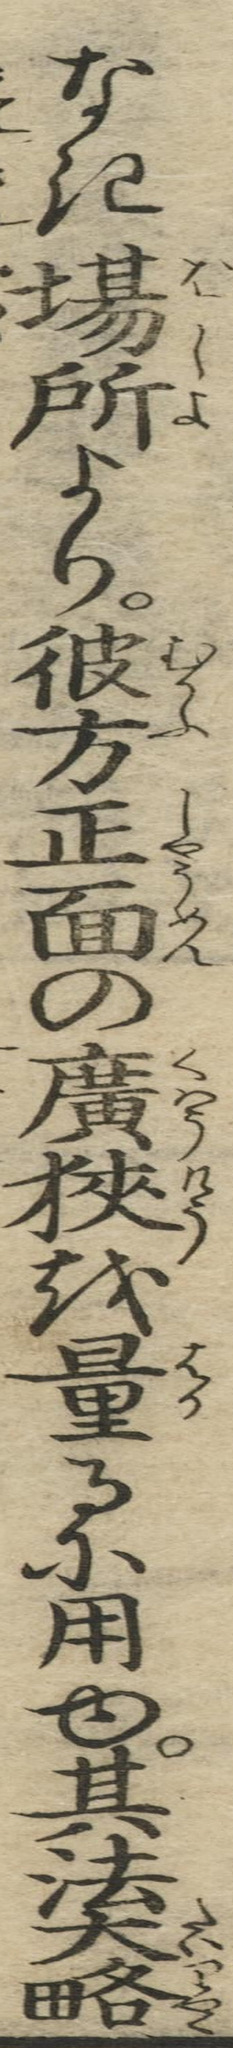なき場所より。彼方正面の廣狭を量るに用ゆ。其法大略
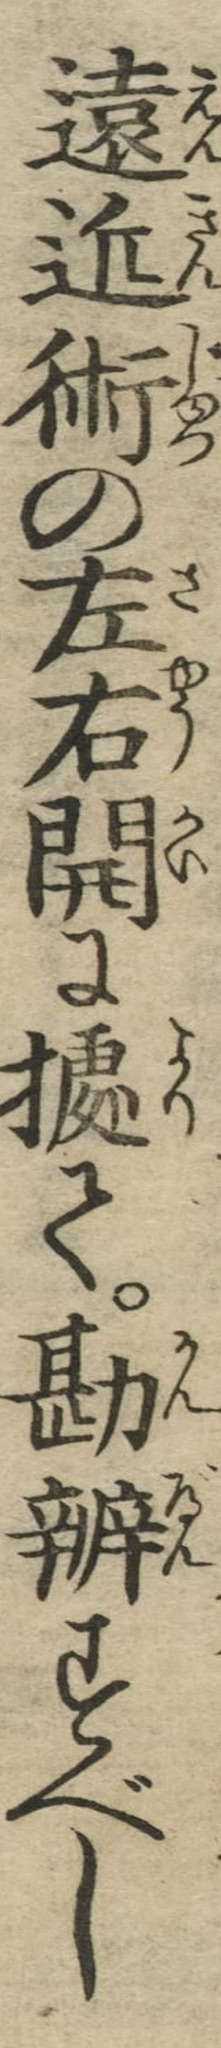遠近術の左右開に拠て。勘辨すべし
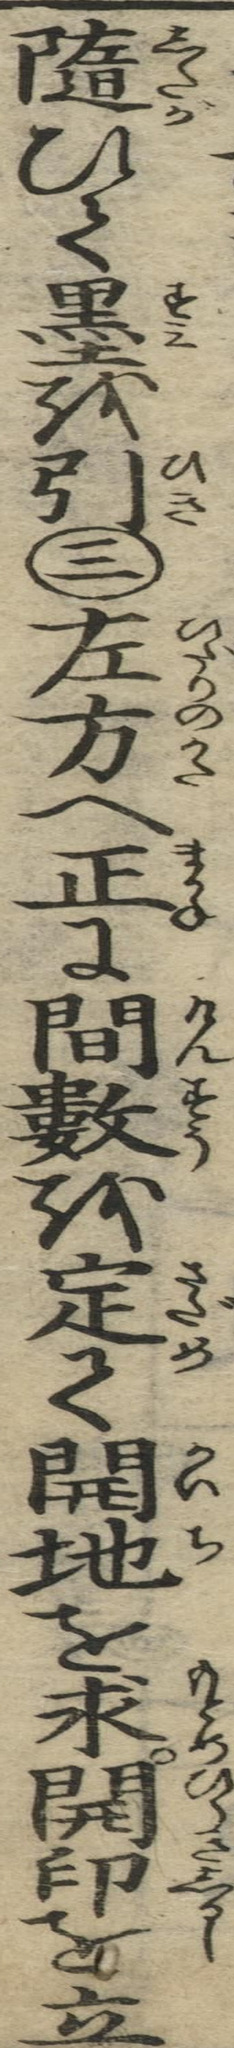随ひて墨を引㊂左方へ正に間数を定て開地を求。開印を立
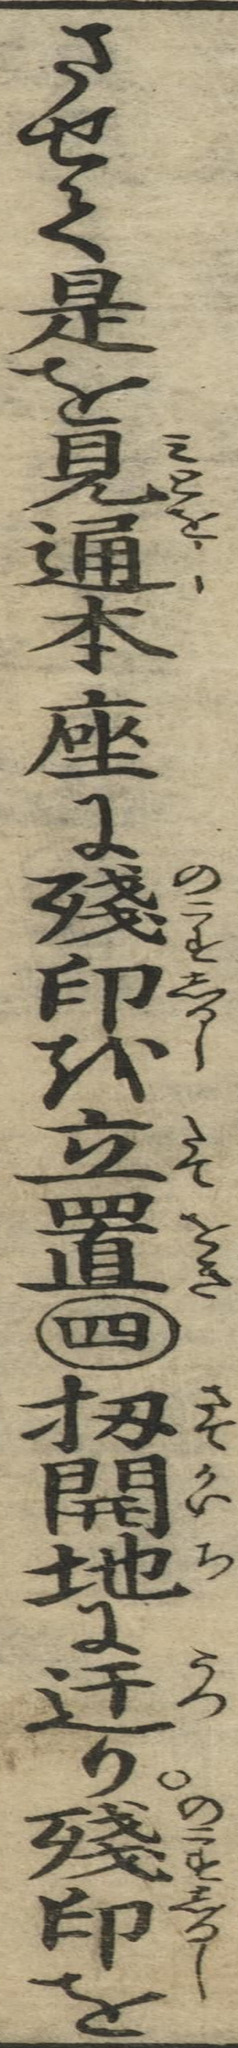させて是を見通本座に残印を立置㊃扨開地に迂り。残印を

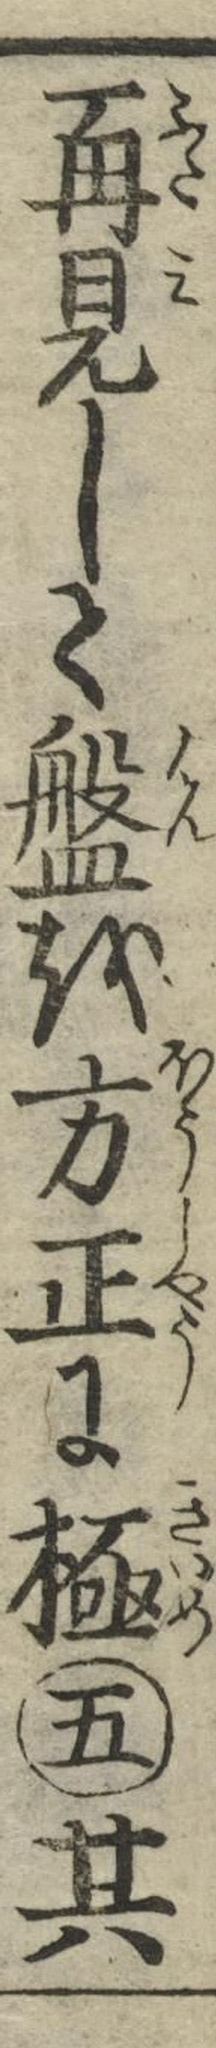再見して盤を方正に極㊄其
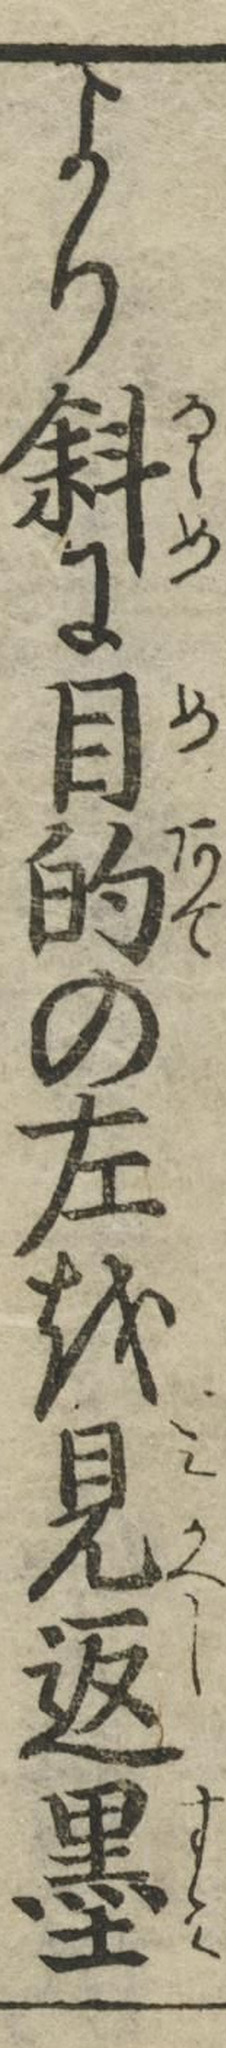より斜に目的の左を見返墨
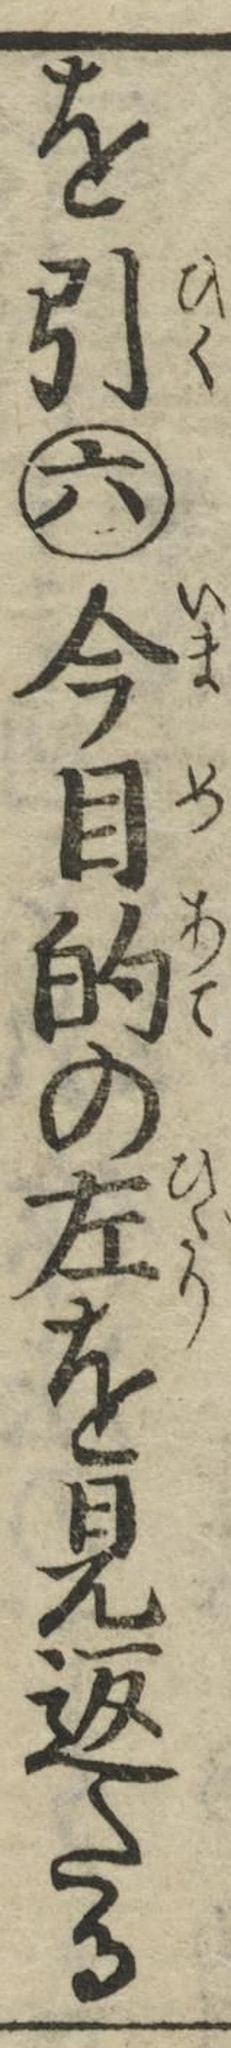を引㊅今目的の左を見返たる
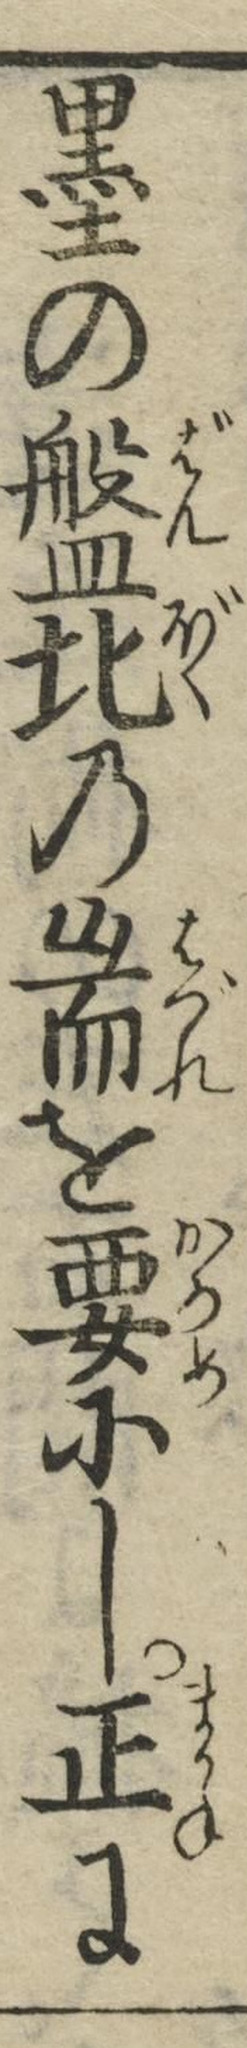墨の盤北の耑を要にし。正に
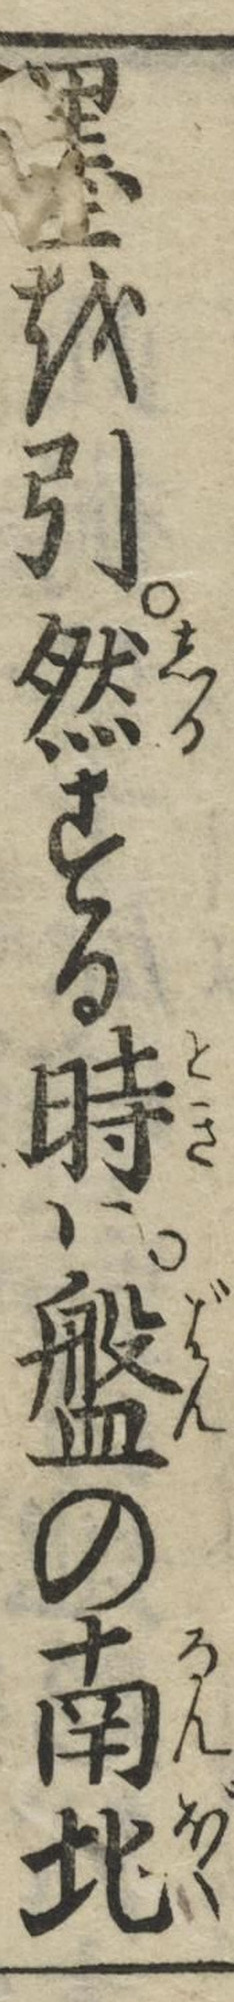墨を引。然する時は。盤の南北
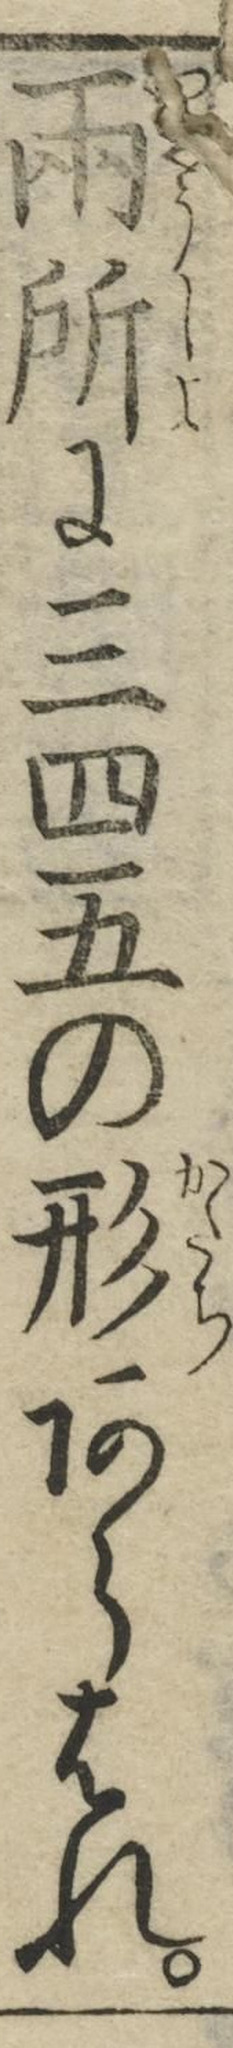両所に三四五の形あらはれ。
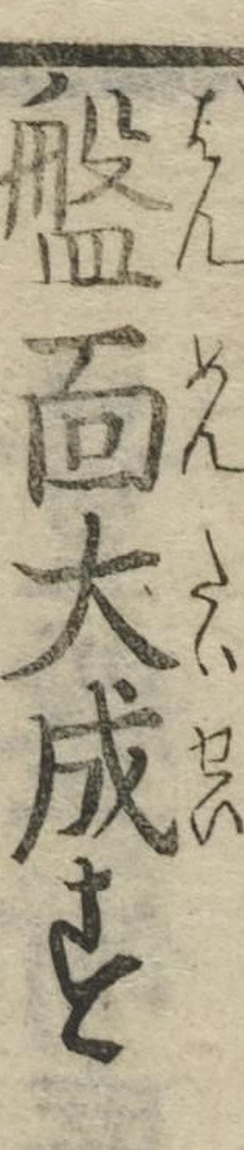盤面大成す
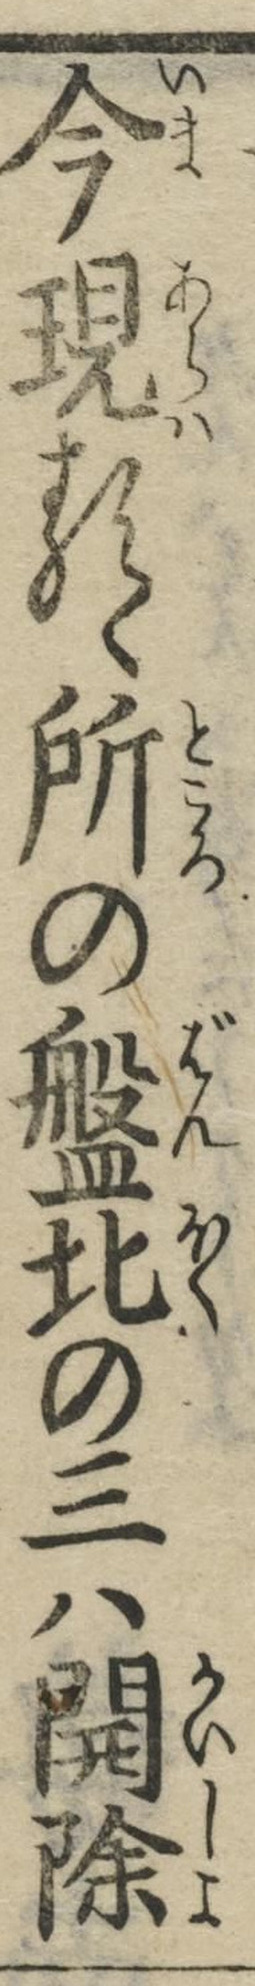今現るゝ所の盤北の三は開徐
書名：量地指南　巻之三（内題）
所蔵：東京大学地震研究所図書室 Earthquake Research Institute Library, The University of Tokyo, JAPAN
